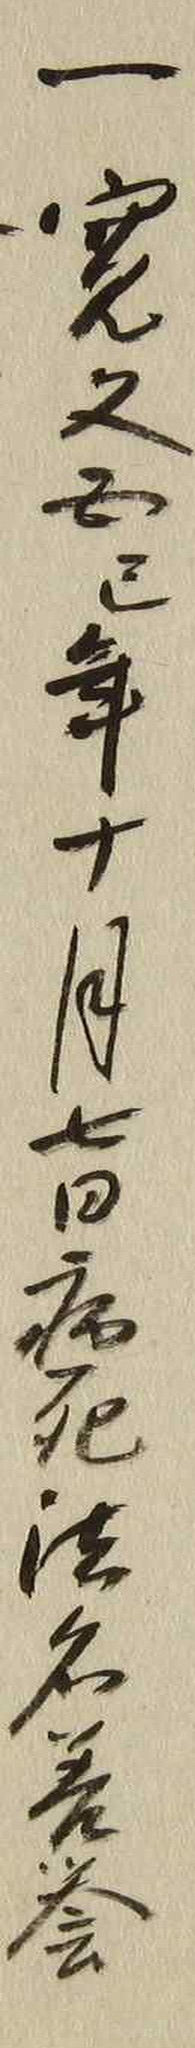一寛文五巳年十月七日病死法名善誉
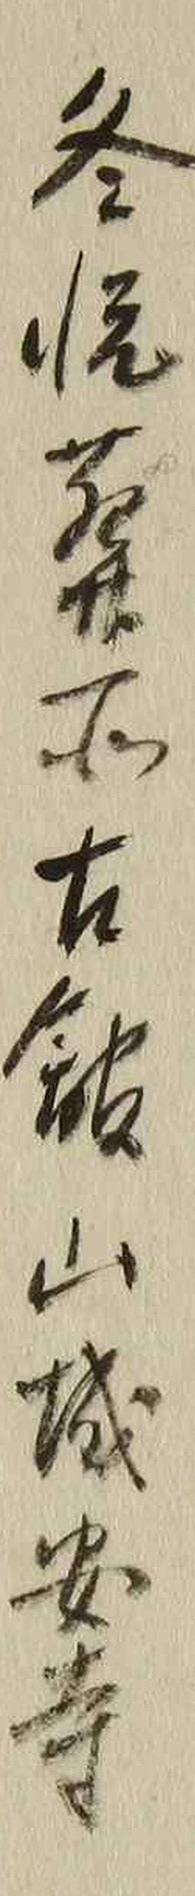冬悦葬所古館山城安寺
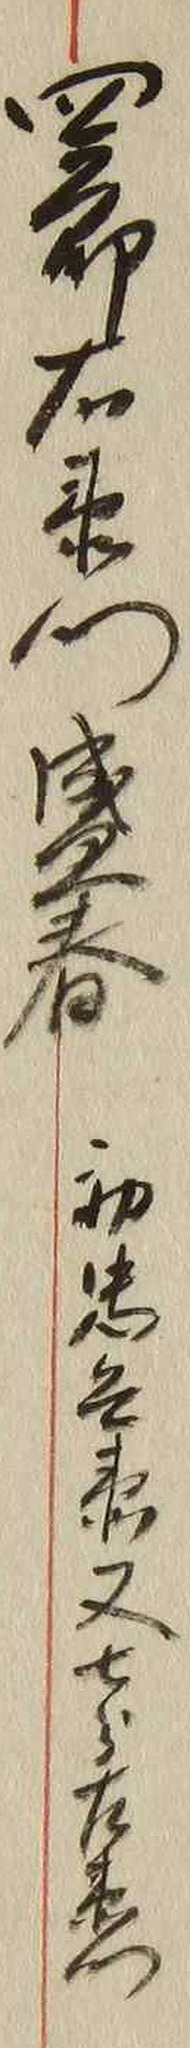四郎右衛門盛春初忠兵衛又七郎左衛門
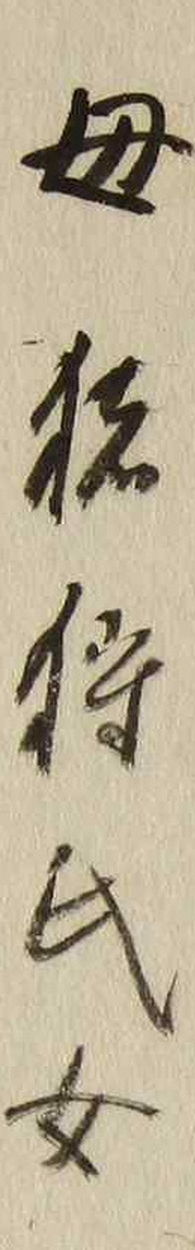母猪狩氏女

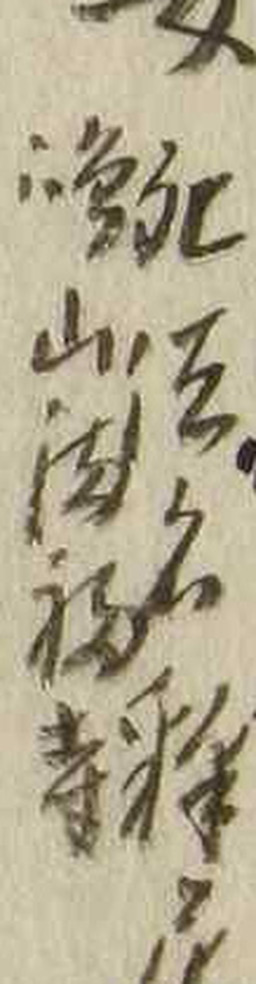嶋山法福寺
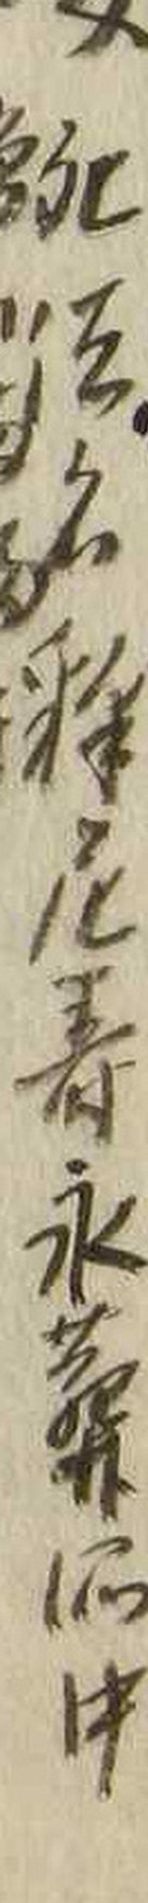死法名釈尼寿永葬所中
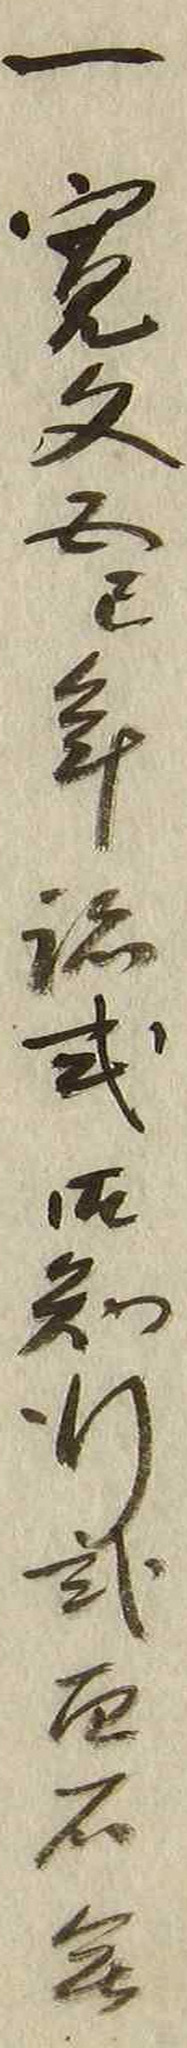一寛文五巳年跡式御知行弐百石無
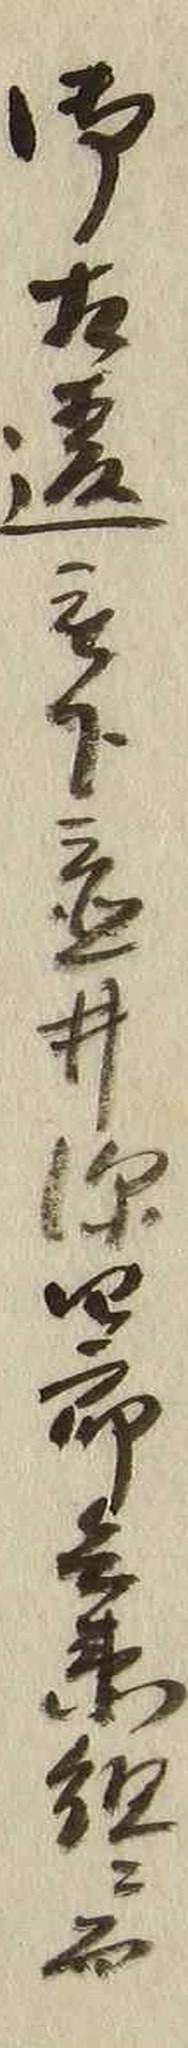御相違日下置井深四郎兵衛組に而
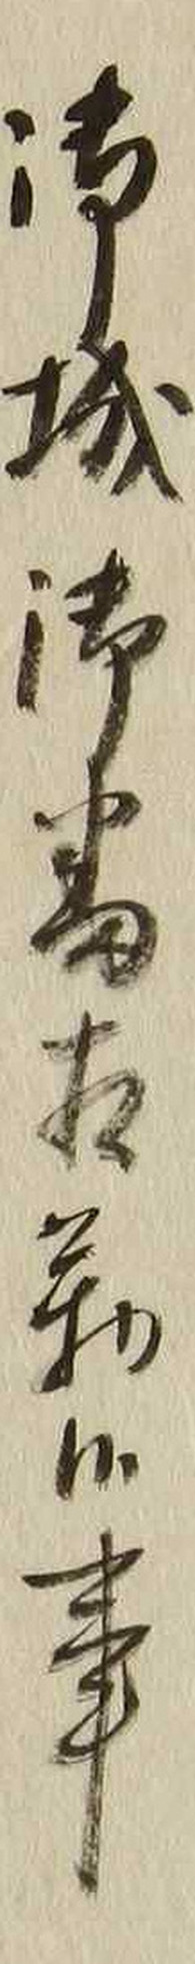御城御番相勤候事
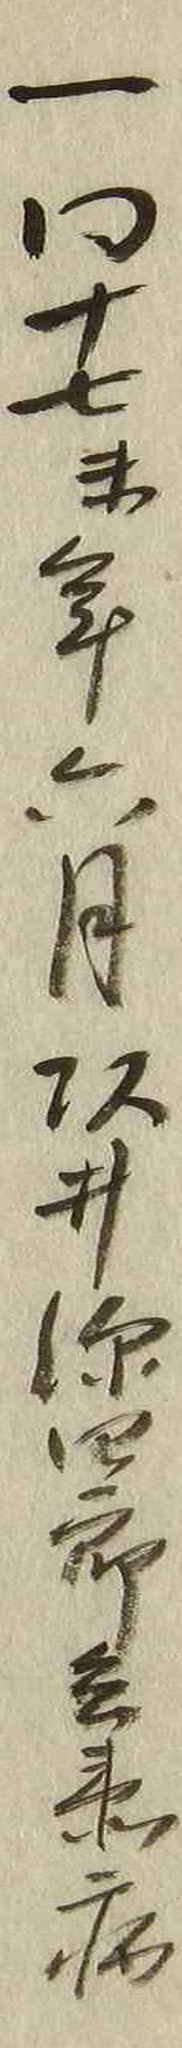一同十七未年六月頭井深四郎兵衛病
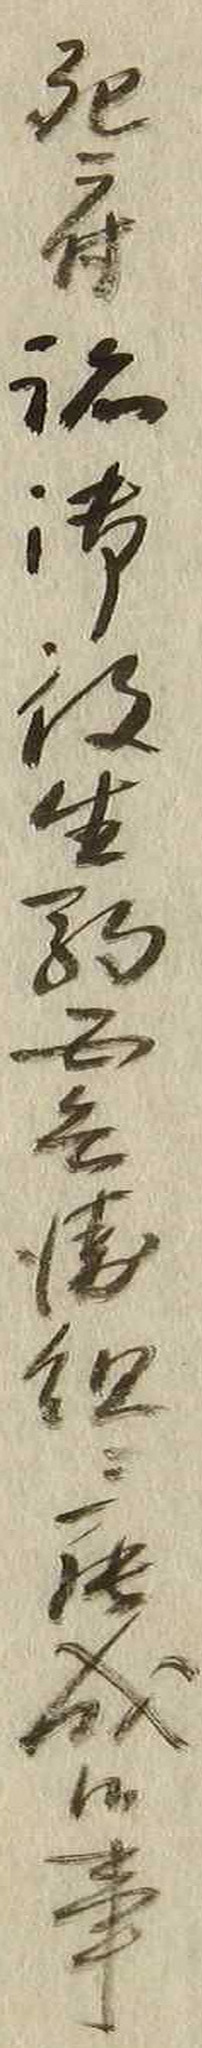死に付跡御役生駒五兵衛組に罷成候事
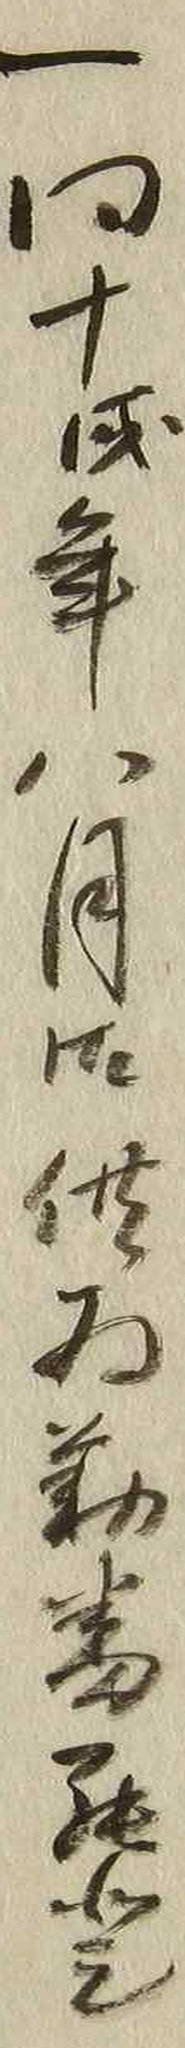一同十戌年八月御供為勤番罷登
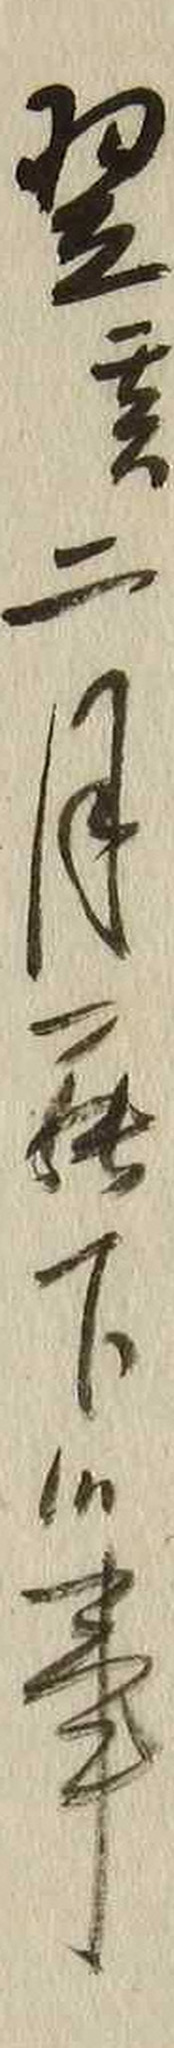翌亥二月罷下候事
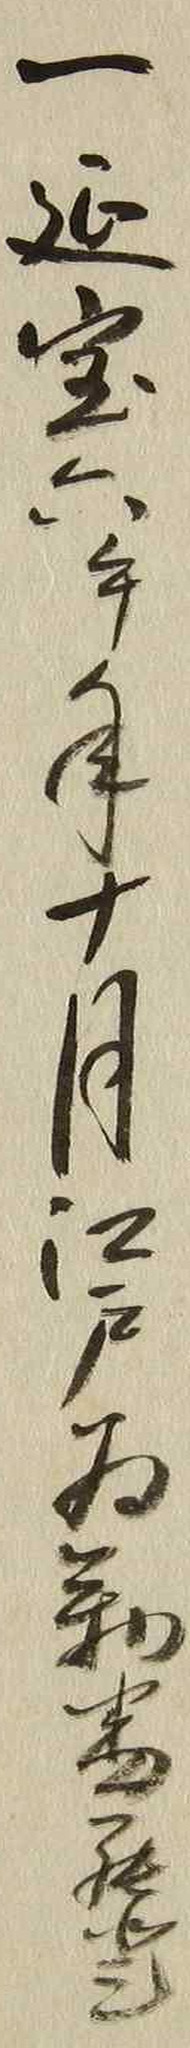一延宝六午年十月江戸為勤番罷登
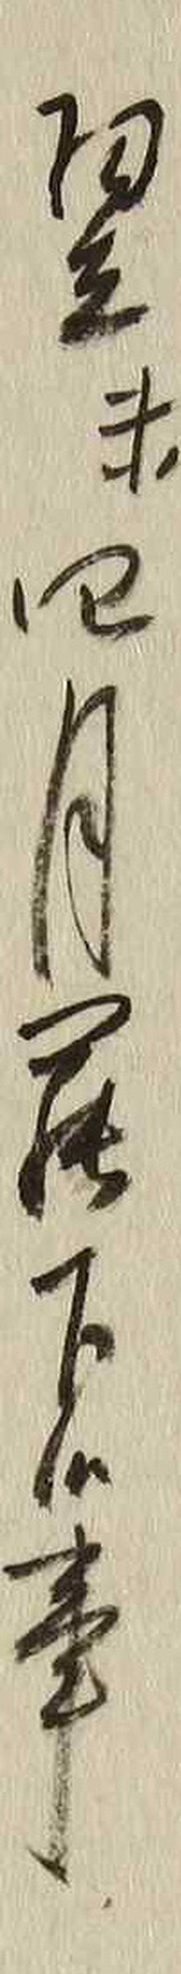翌未四月罷下候事
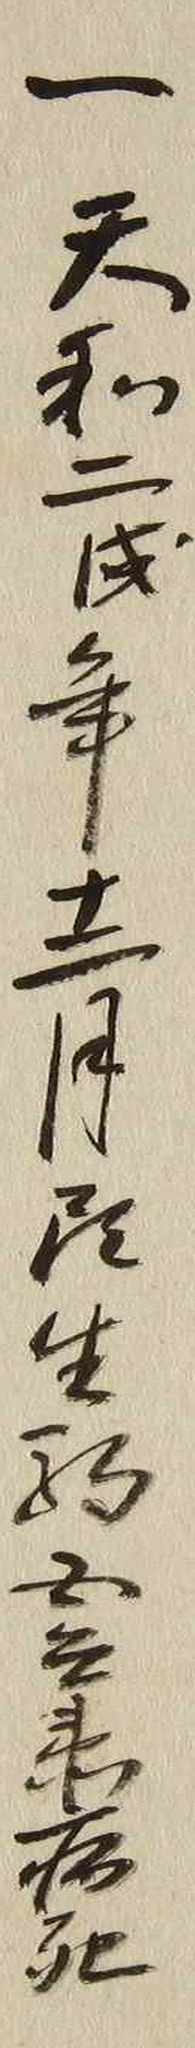一天和二戌年十二月頭生駒五兵衛病死
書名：諸士系譜　巻之360　す之部10
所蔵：会津若松市立会津図書館
